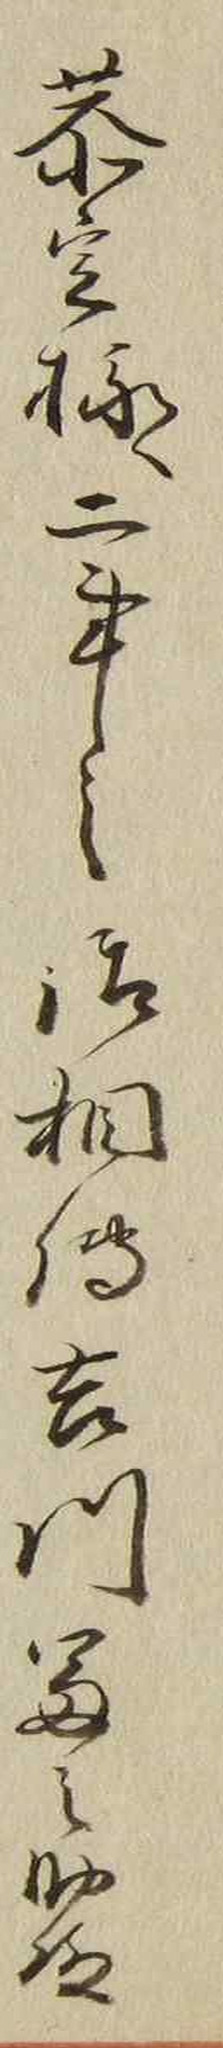恭定様ヘ二事之御相伝吉川富之助殿
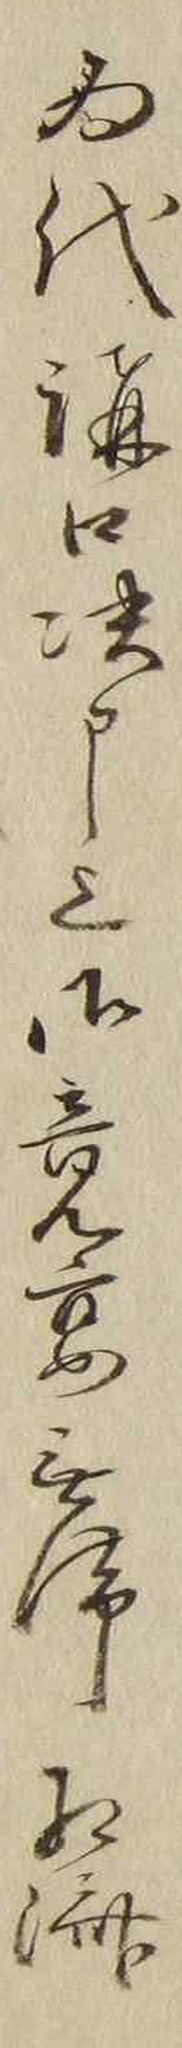為代講口決申上御竟宴無滞相済

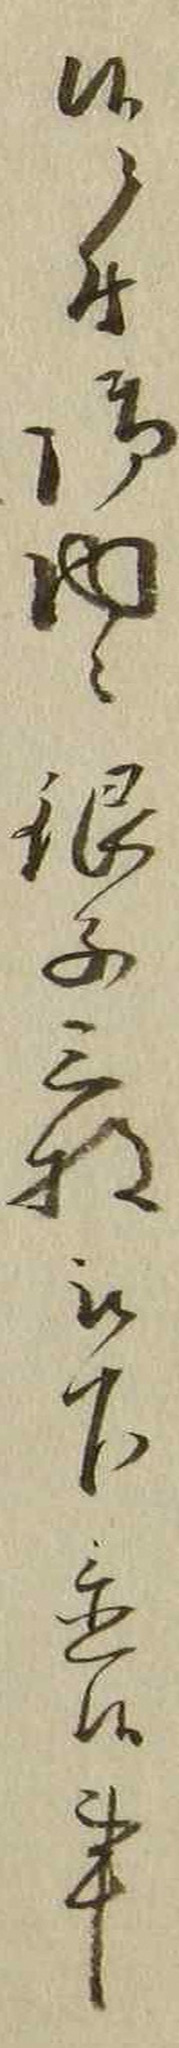候ニ付御内々銀子三枚被下置候事
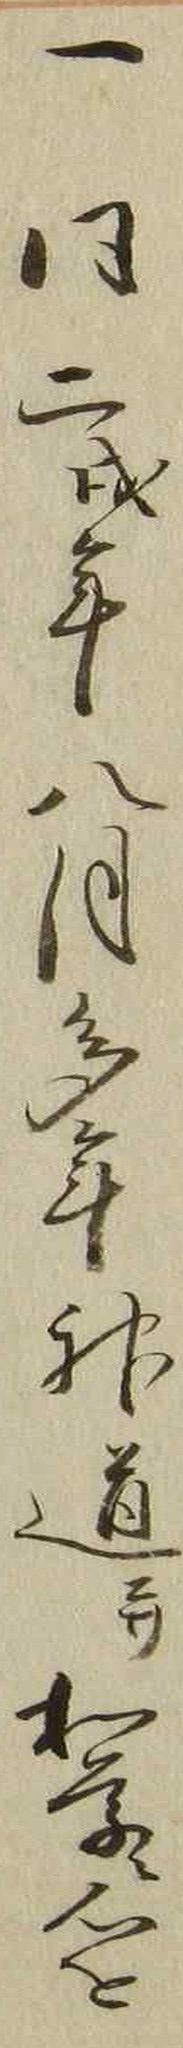一同二戌年八月多年神道幷和学ニ心を
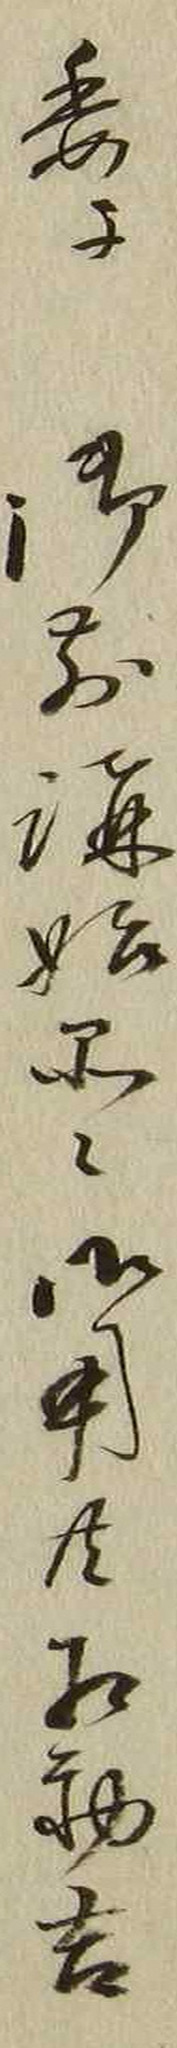委ね御前講始品々御用共相勤吉
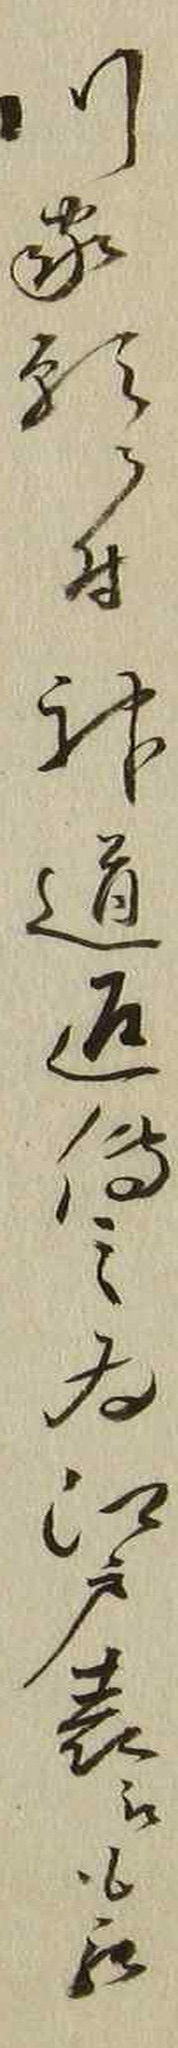川家願ニ付神道返傳之為江戸表江も罷
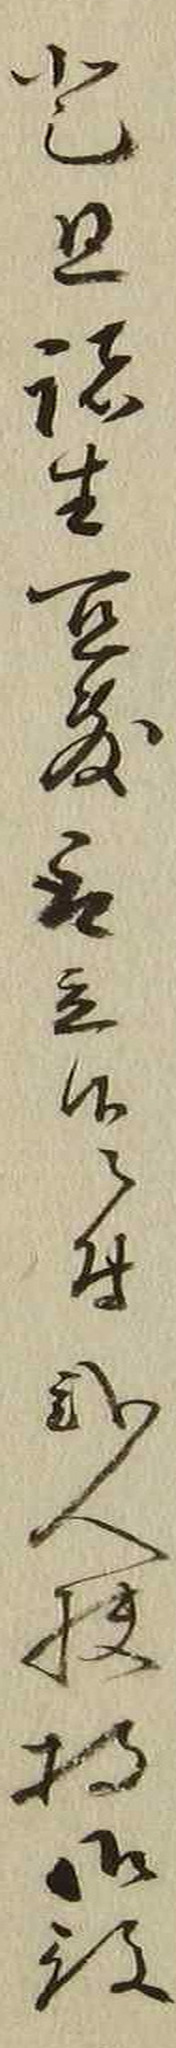登且諸生宜敷取立候ニ付弐人扶持御役
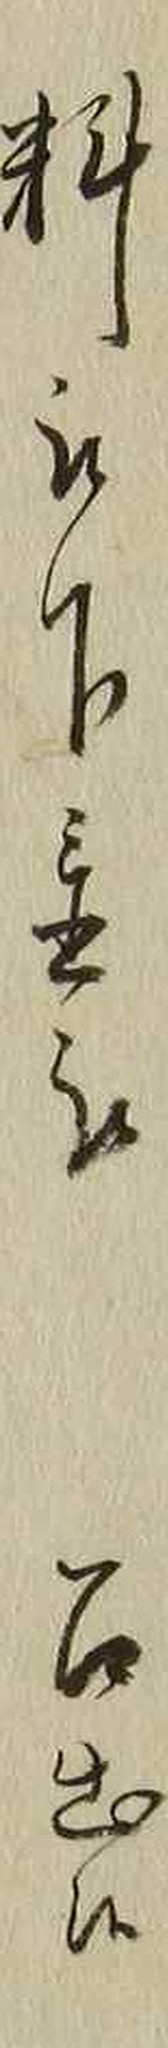料被下置被召出候
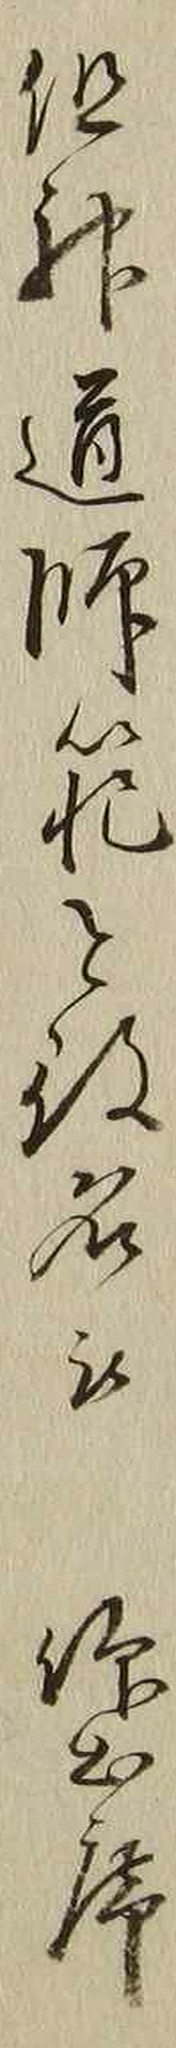但神道師範と役名被仰出席
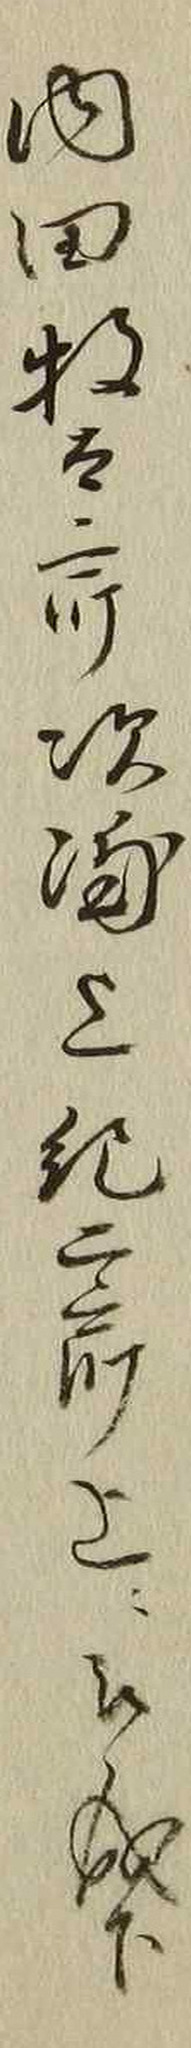内田牧太郎次浦上紀二郎上ニ被成下
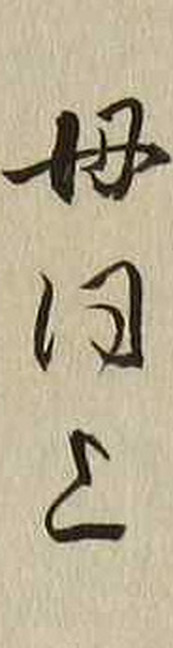母同上
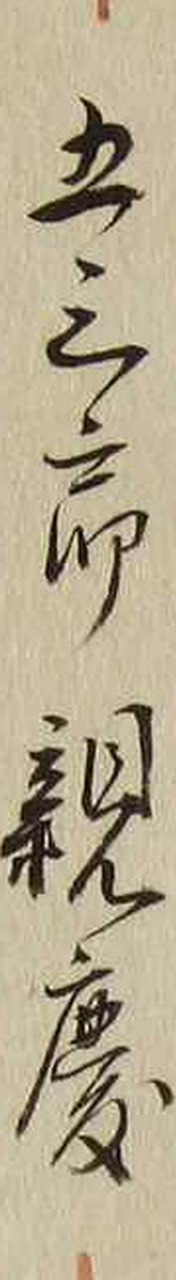五三郎親慶
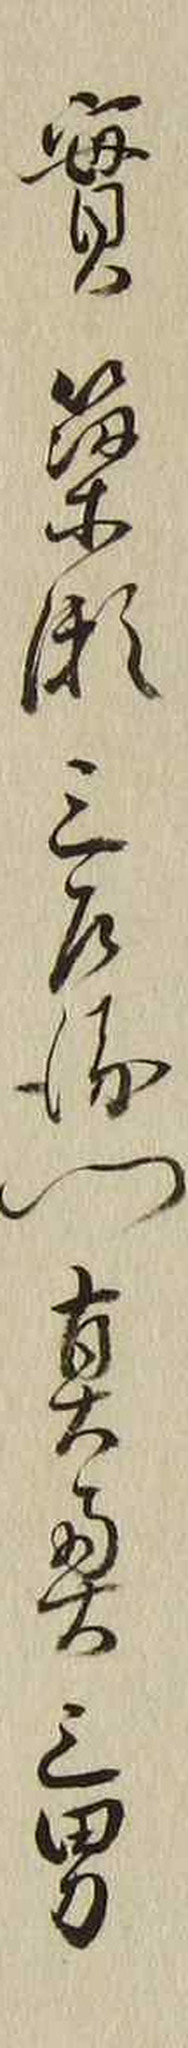実簗瀬三左衛門真興三男
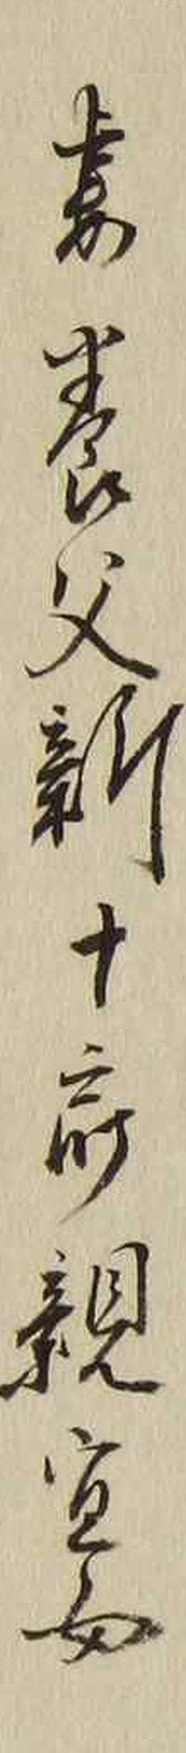妻養父新十郎親宜女

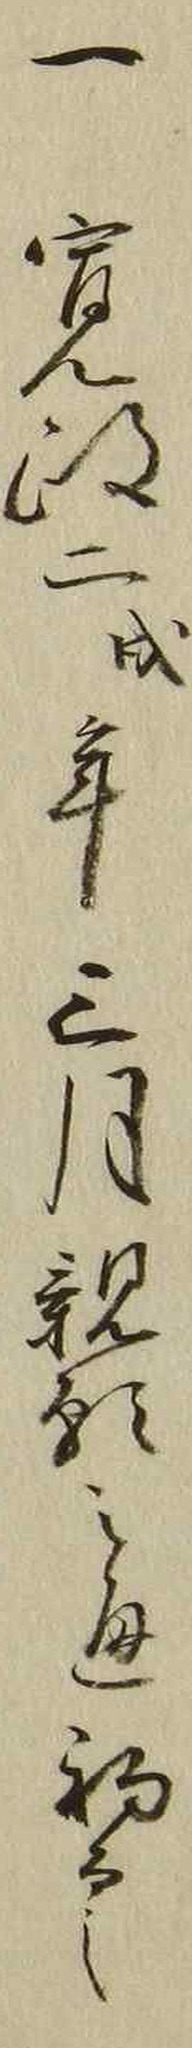一寛政二戌年三月親願之通初而之
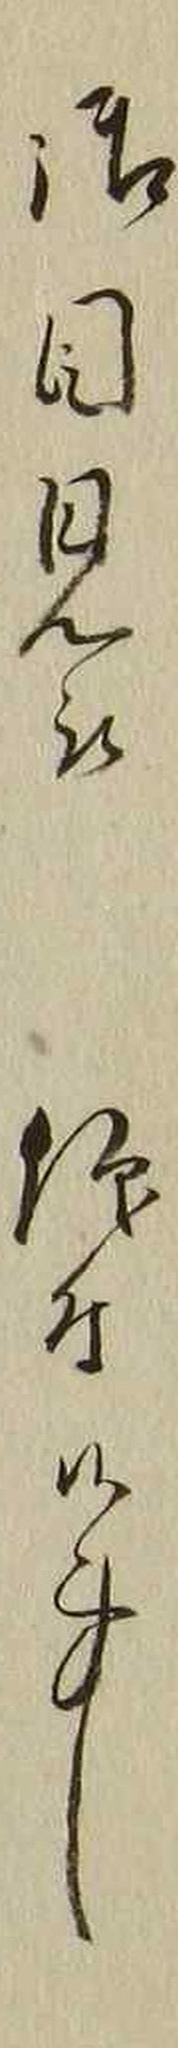御目見被仰付候事
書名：諸士系譜　巻之68　を之部2
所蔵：会津若松市立会津図書館
